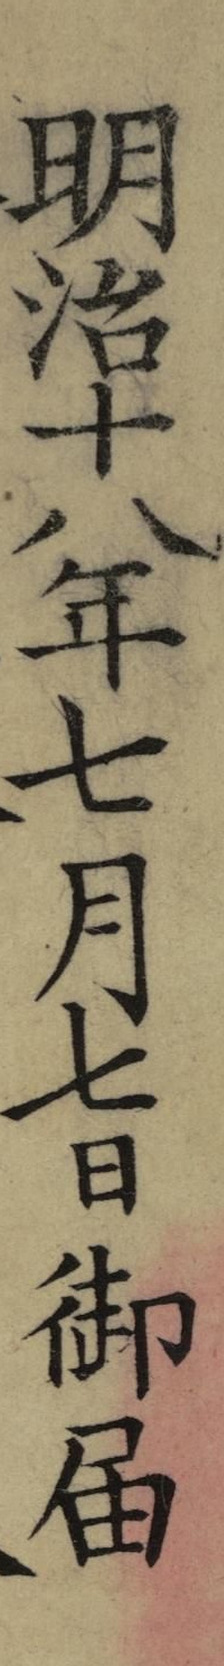明治十八年七月七日御届
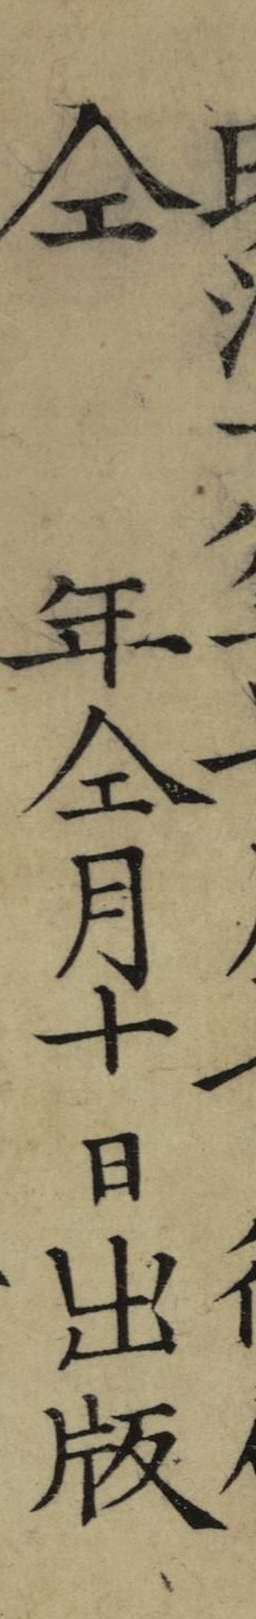同年同月十日出版
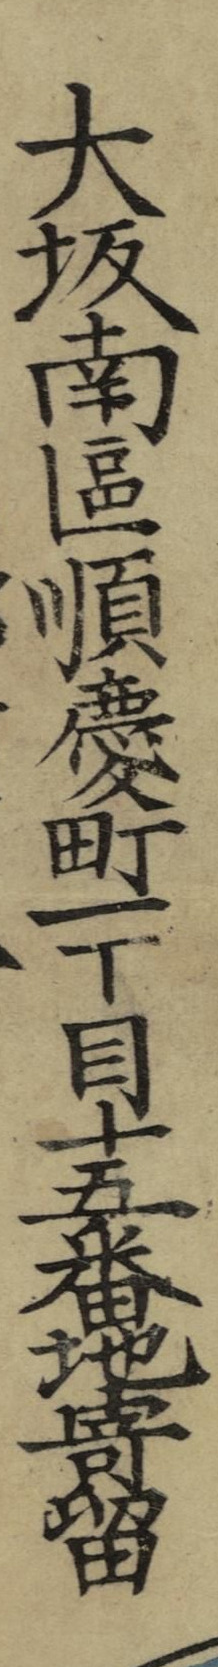大阪南区順慶町一丁目十五番地寄留
